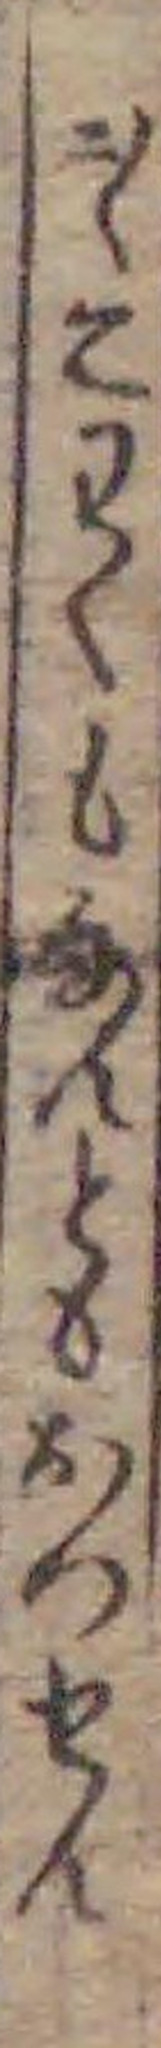ヲヽこわくもなんともおつせん
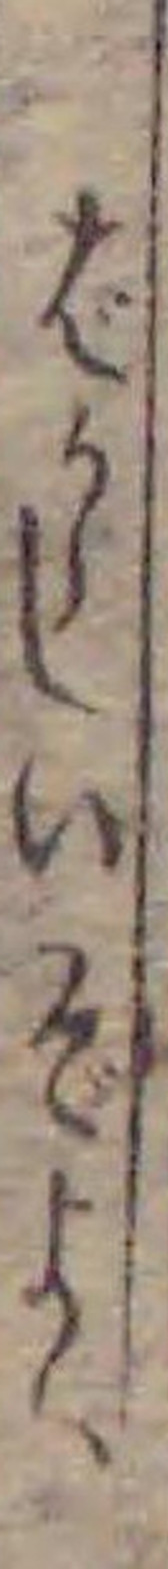ばからしいぞよへ
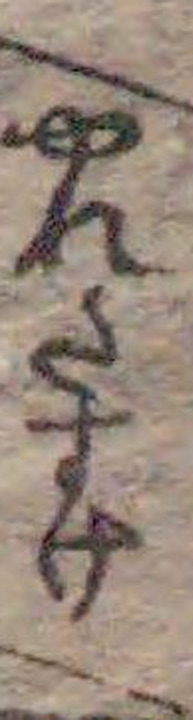やれたすけ
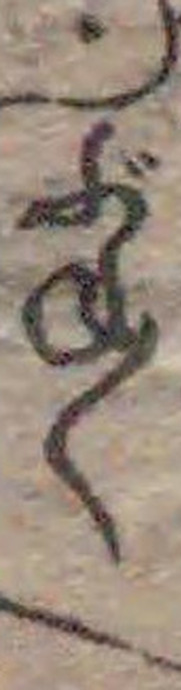ぶね〳〵
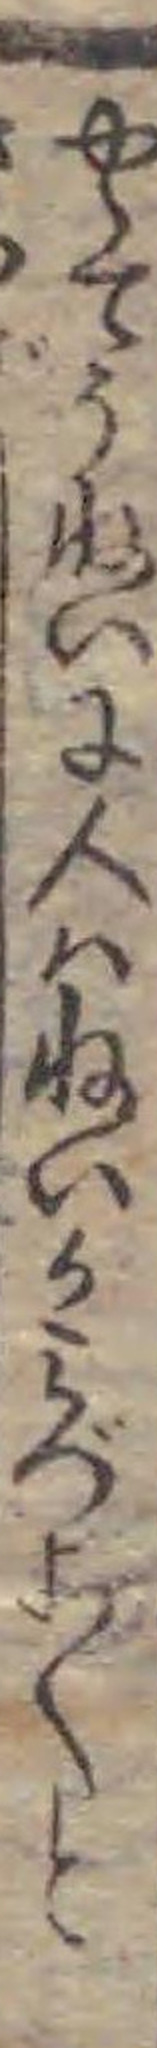やらてうねいに人はねいかみづよ〳〵と
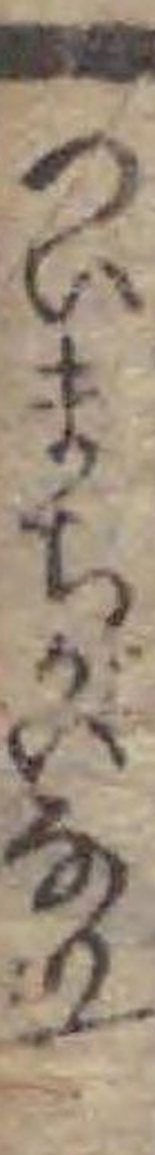ついまちがいなり
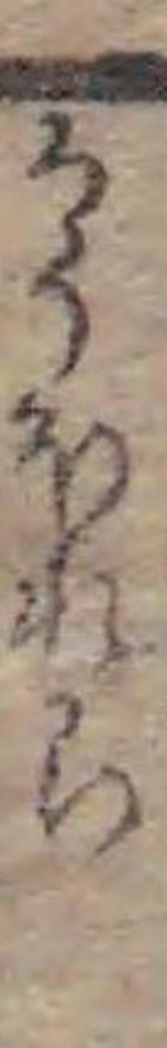かうほれら
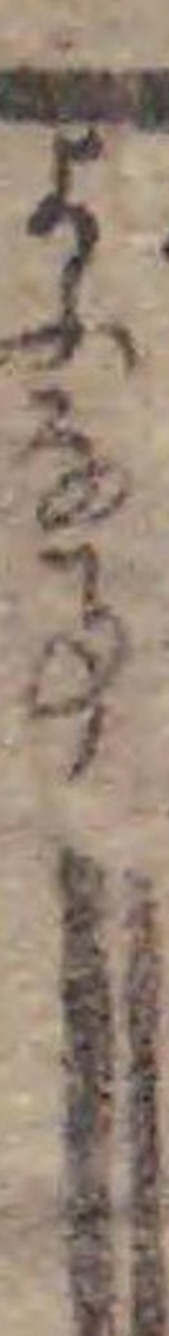よふな事
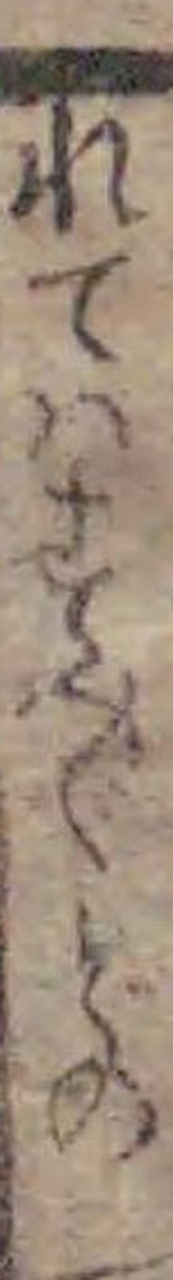れてはすへ〴〵どの
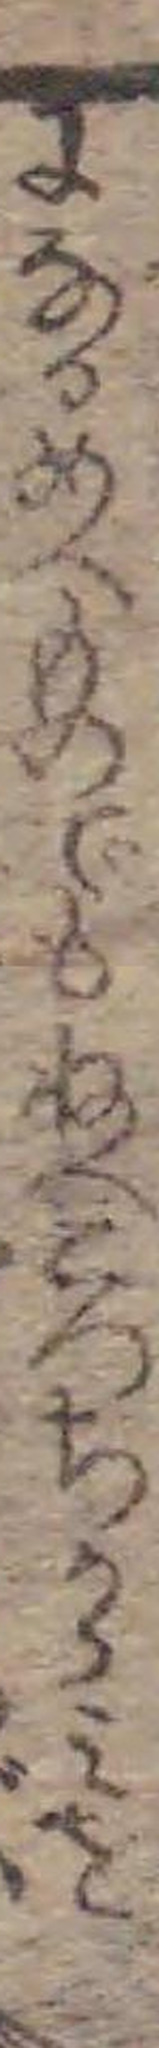になるめへものでもねへこつちからみを
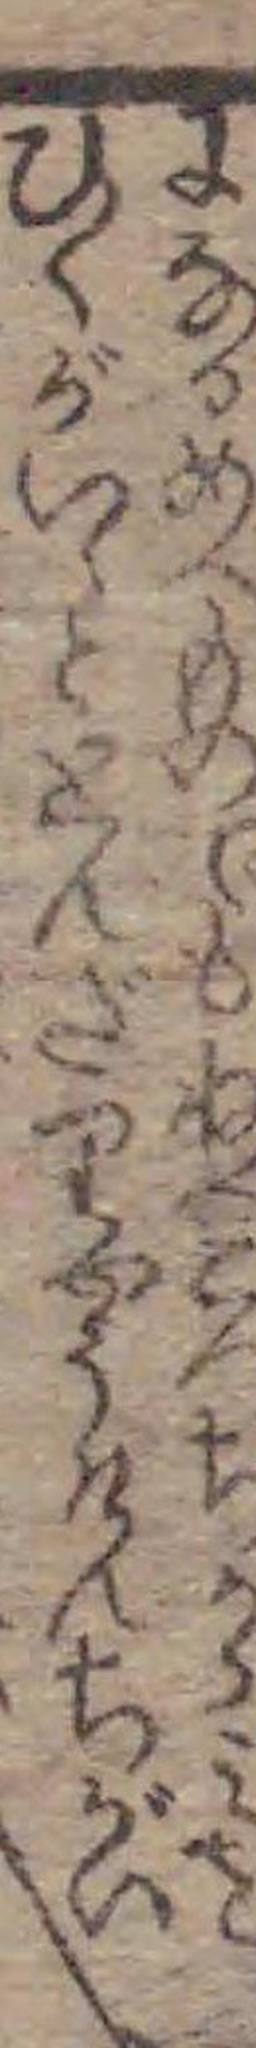ひくがいゝととんだりやうけんちがい
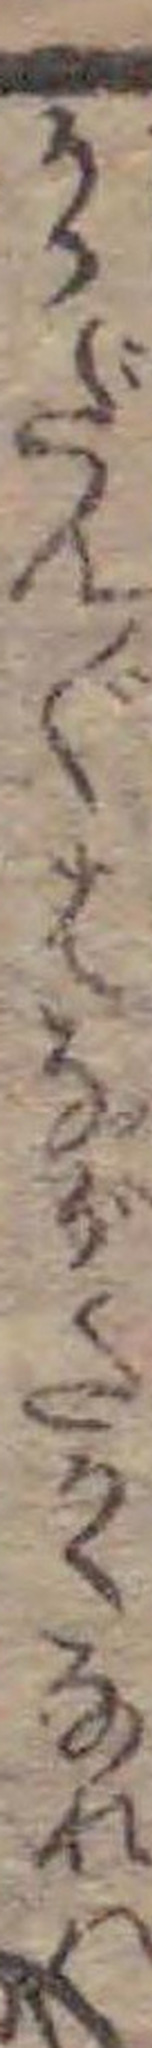からだん〴〵はながたかくなれは
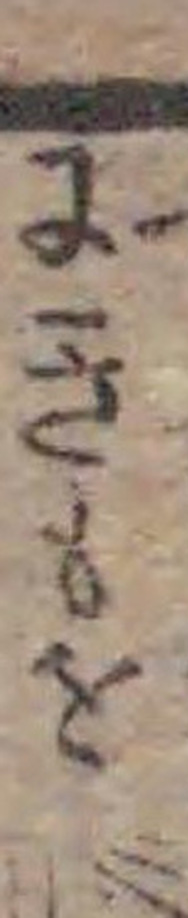にきもを
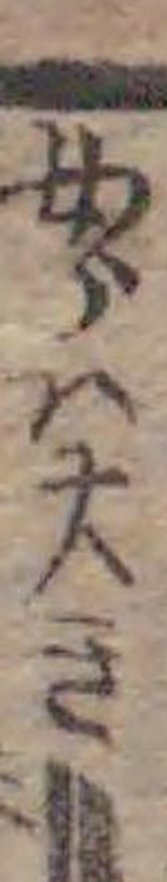女郎は大き
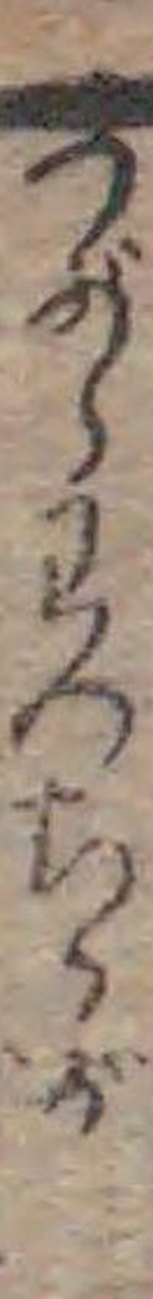つぶしわつちらが
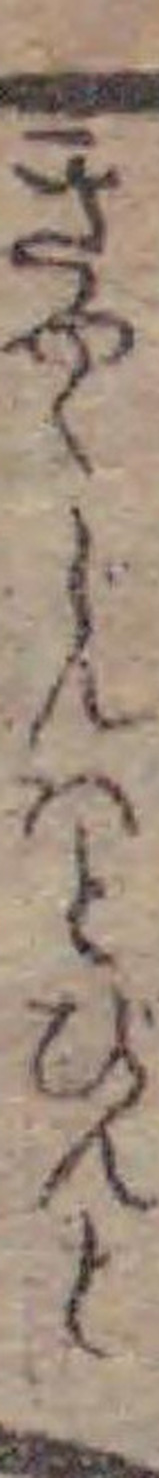きやくじんはとびんと
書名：化物楽屋異牒 : 2巻
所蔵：国立国会図書館 National Diet Library, JAPAN
